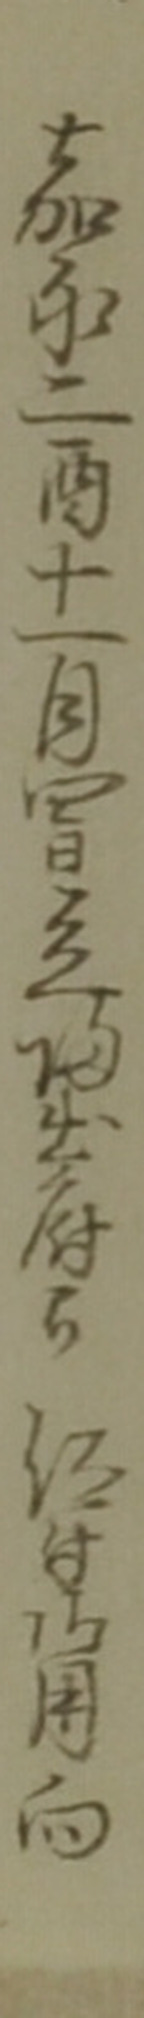一嘉永二酉十一月四日立帰出府被仰付御用向
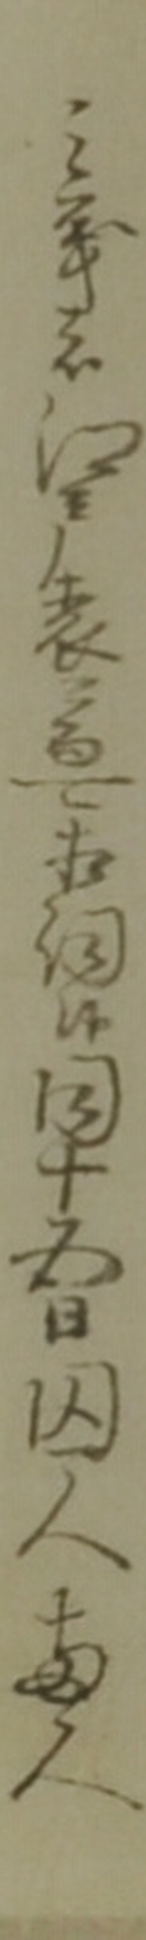之義者江戸表ニ而可相伺候同十五日囚人両人

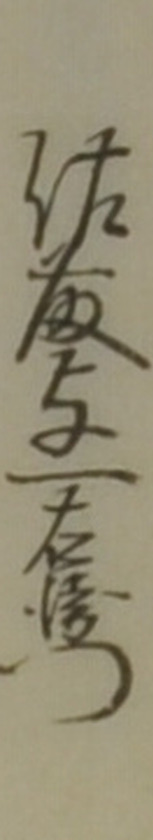佐藤与一右衛門
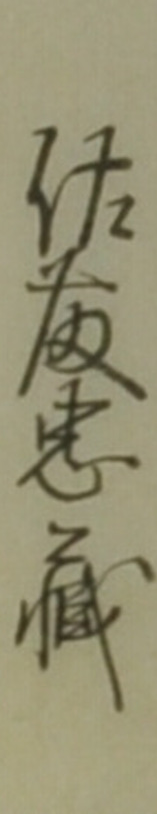佐藤忠蔵

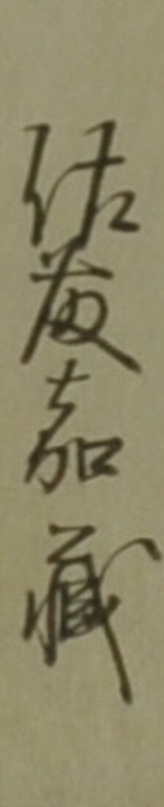佐藤嘉蔵
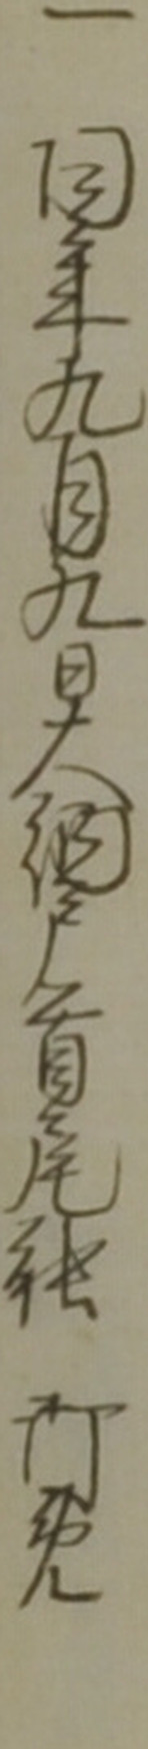一同年九月九日大納戸首尾能御免
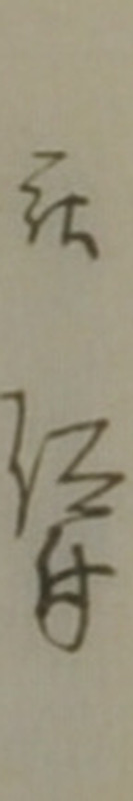被仰付
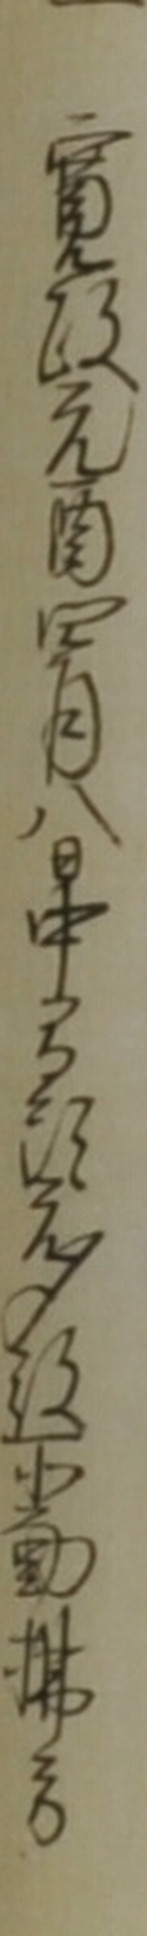一寛政元酉四月八日中間頭元〆役所勤払方
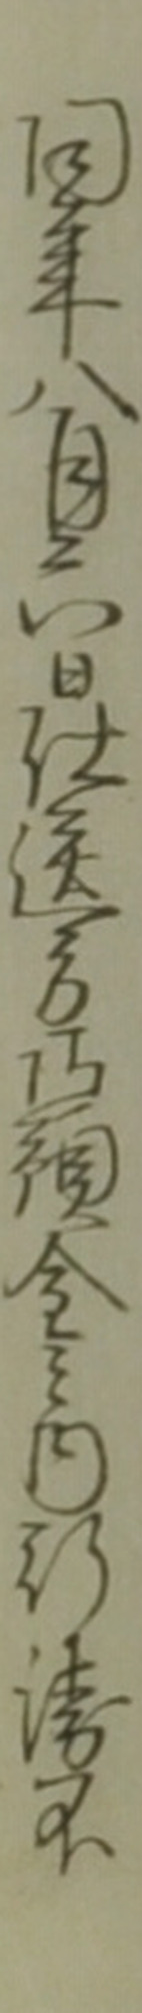一同年八月六日仕送方御預金之内行衛不
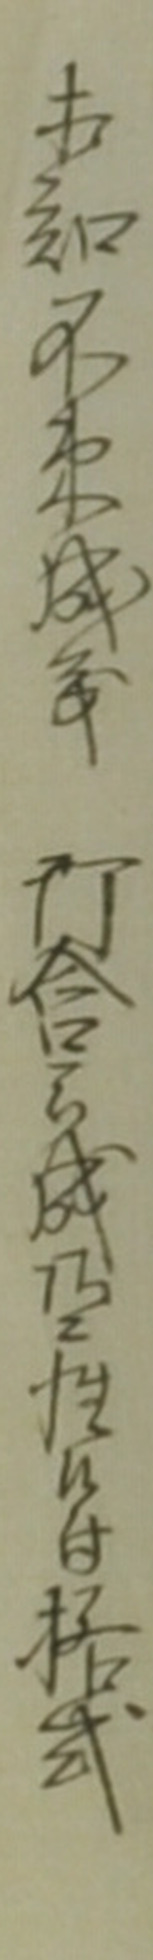相知不束成義御含被成御座候付格式

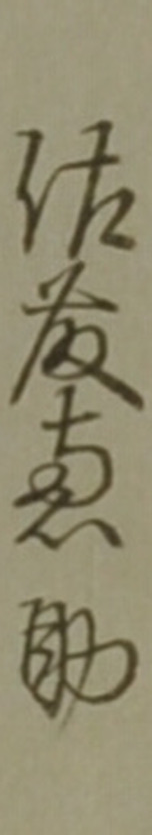佐藤恵助

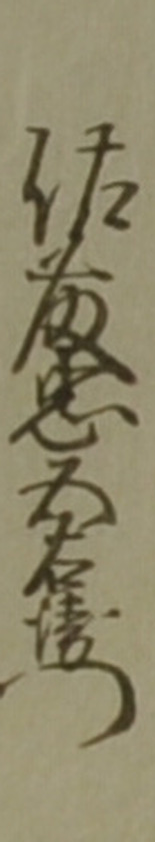佐藤忠五右衛門
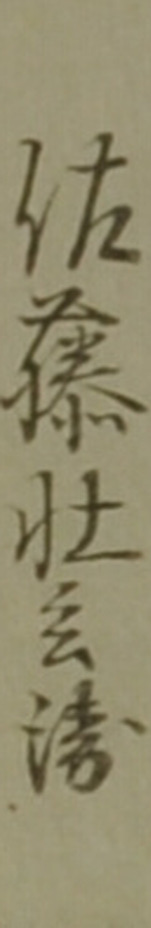佐藤壮兵衛

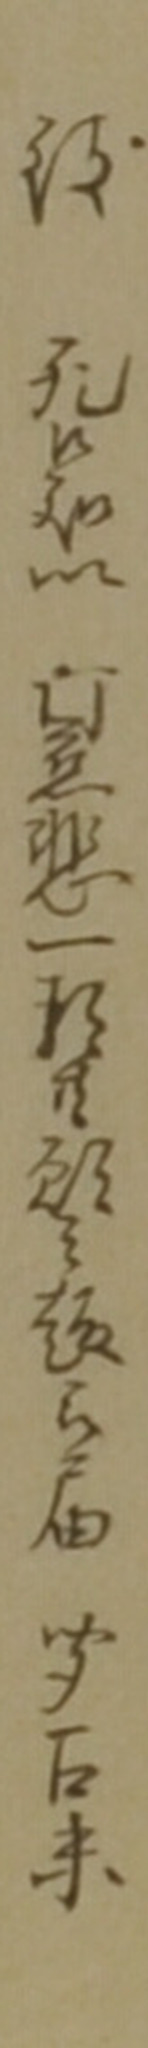致死候処以御慈悲一類共願之趣被届聞召未
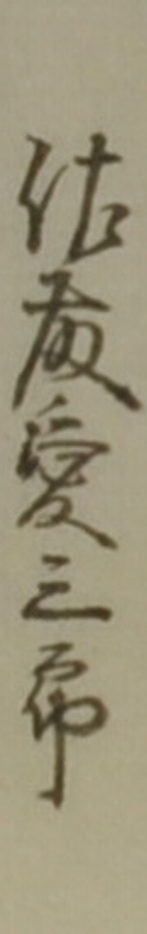佐藤愛三郎
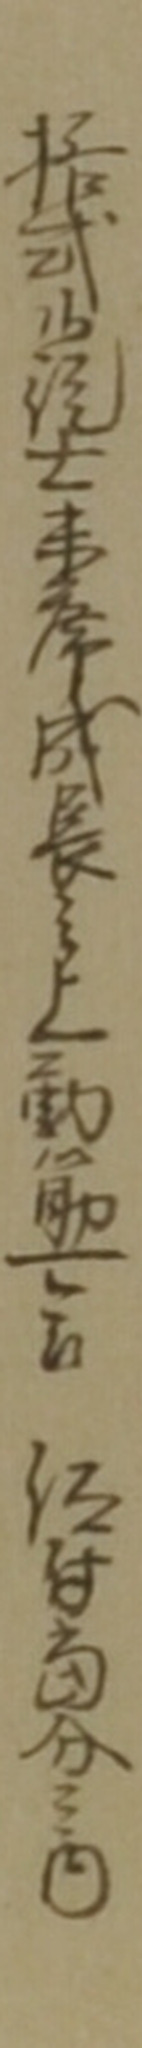格式御徒士末席成長之上勤筋可被仰付当分之内
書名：無足諸士勤仕録（六）
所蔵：伊那市立高遠町図書館・合同会社AMANE
